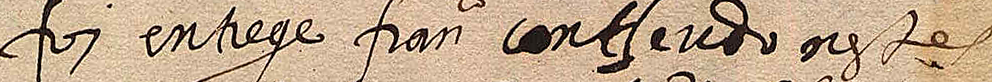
foj entrege franco contheudo nestes
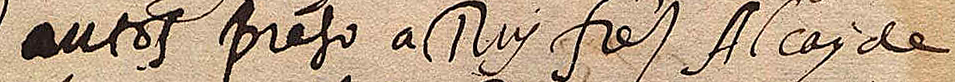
autos preso a Ruj frēz Alcayde
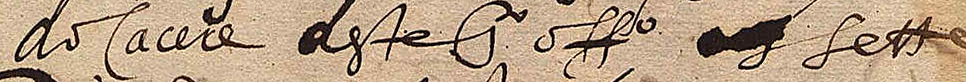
do Cacere deste sto offo aos sette
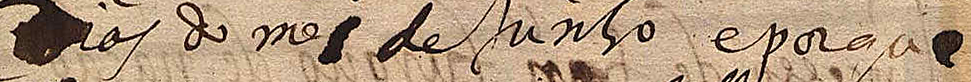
dias do mes de Junho e porque
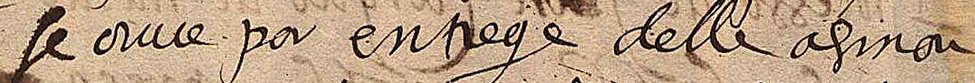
se ouue por entrege delle asinou
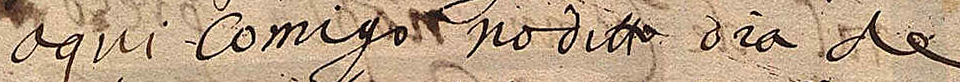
aqui comigo no ditto dia de
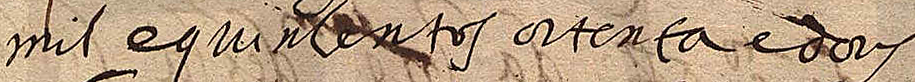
mil e quinhentos oitenta e dous
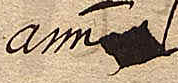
annos
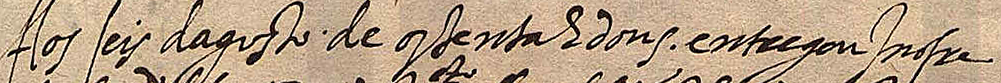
Aos seis dagosto de ojtenta E dous. entregou Jnofre
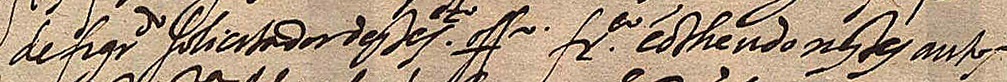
de figrdo solicitador deste s.to offo. fr.co cōtheudo nestes autos
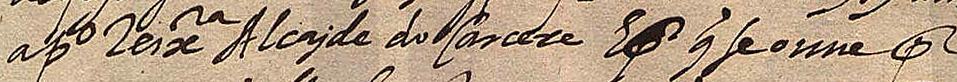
a po teixra Alcajde do Carcere E p̄q̄ se ouue p̄r
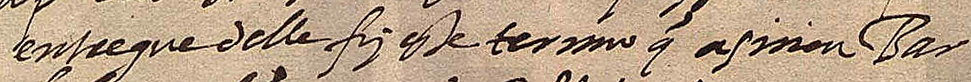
entregue delle diz este termo q̄ asinou Bar
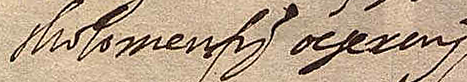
tholomeu frz̄ o escreuj
